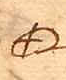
42
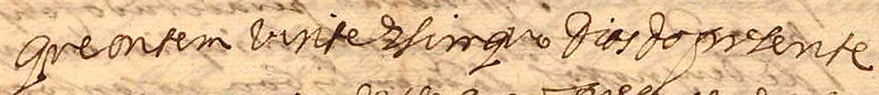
que ontem vinte E simquo dias do presente
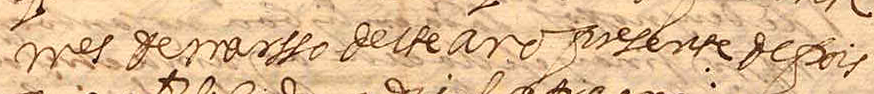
mes de marsso deste ano presente depois
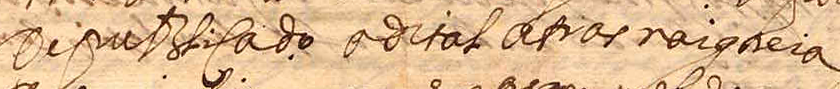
De publiCado o dital atras na igreia
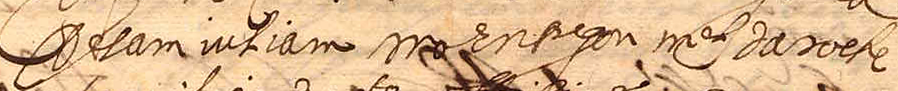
De sam iuliam mo Entregou m.el da rocha
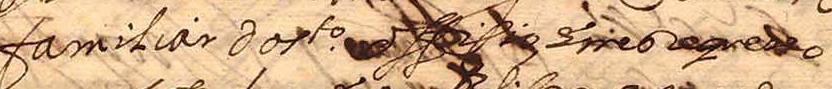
familiar do sto. offiCio E me requereo
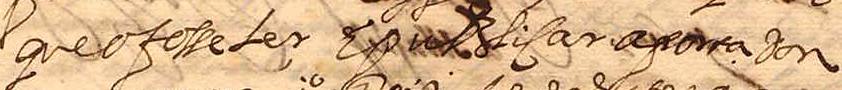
que o fosse ler E publiCar a porta don
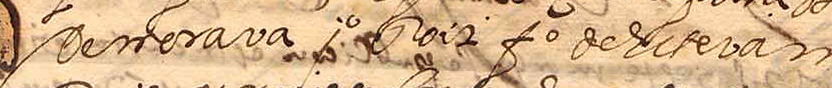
De morava i.o Roiz f.o de Estevam
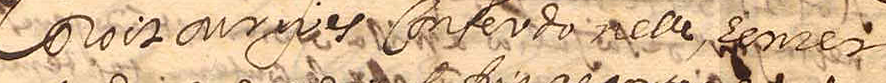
Roiz ourives Conteudo nelle, E en uer
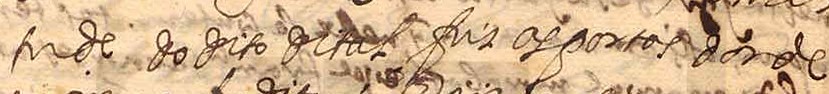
tude do dito dital pus as portas donde
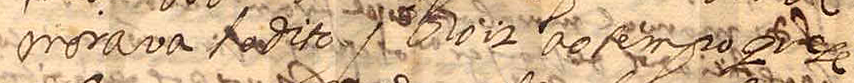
morava ho dito j.o Roiz ao tempo que se
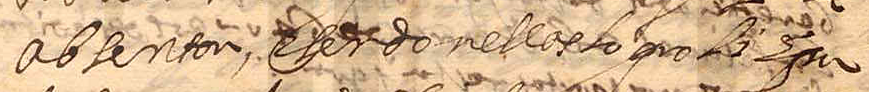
absentou, e sendo nellas logro li E pu
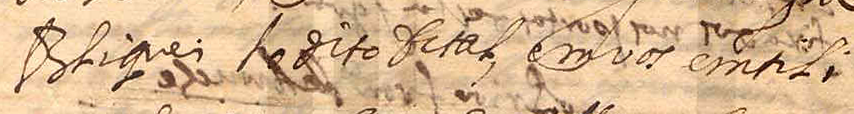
bliquei ho dito dital, em vos emtili
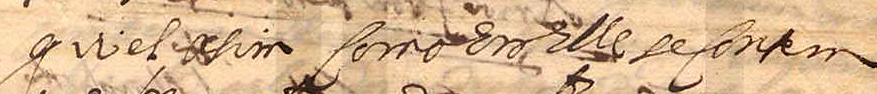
giuel asim Como Em Elle se Contem
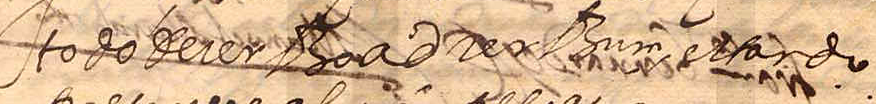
todo dezer bē ad verbum estando
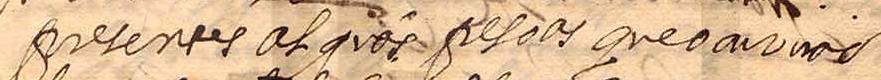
presentes alguās pesoas que o ouviraõ
